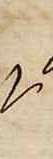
1o
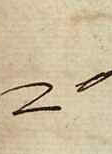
2o
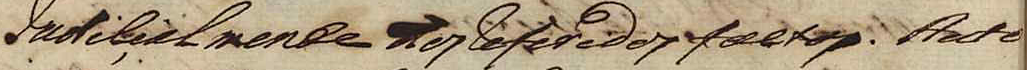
IudiÇiaLmente dos Referidos factos. Auto
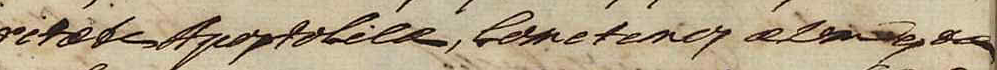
ritate ApostoLica, Cometemos a vm esta
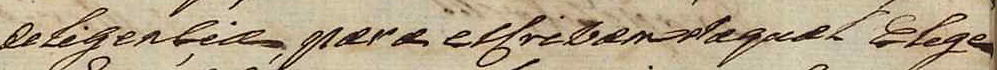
deligençia, para esCrivam da qual Elege
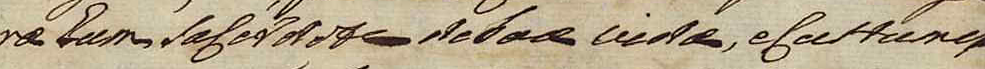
ra hum saCerdote de boa uida, e Custumes
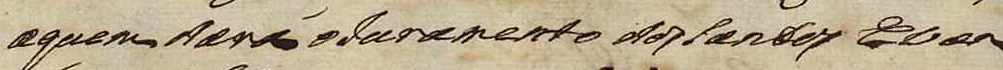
a quem dará o Iuramento dos santos Evan
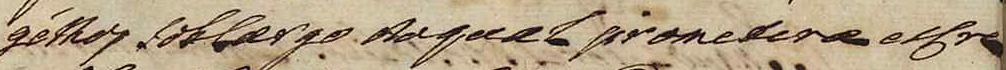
gélhos sob cargo da qual prometera esCre
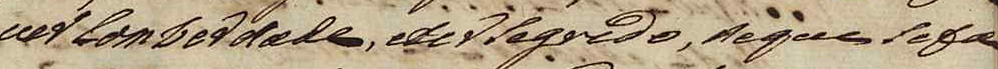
uer Com verdade, e ter segredo, de que se fa
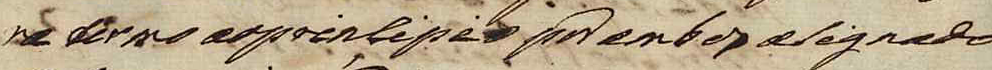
ra termo ao prinçipio por ambos asignado
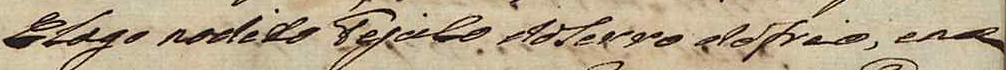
E Logo no dito Tejuco do serro do frio, e na
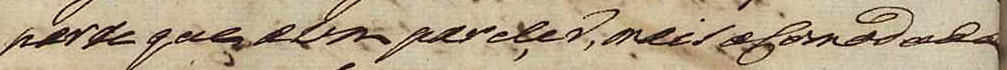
parte que a vm pareçer, mais aComodada
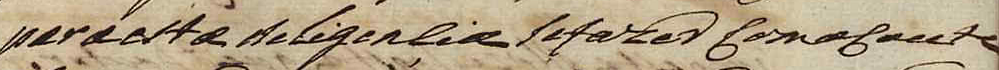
para esta deLigençia se fazer Com a Caute
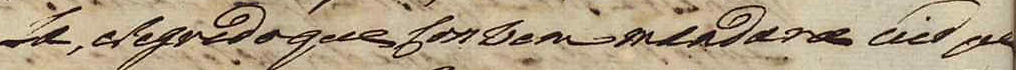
La, e segredo que Convem mandara uir pe
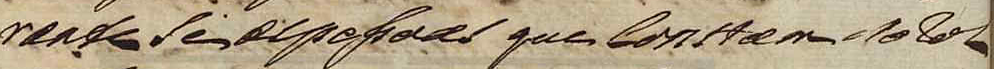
rante si as pessoas que constam do Rol
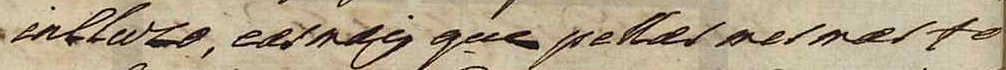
inCluzo, e as mais que pellas mesmas fo
